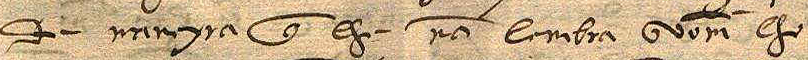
de maneyra q̄ lhe nā lembra soomte lho
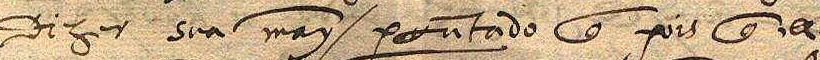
dizer sua mãy / ꝑgūtado q̄ pois q̄ elle
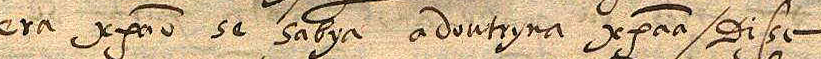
era xpāo se sabya a doutryna xp̄aa / disse
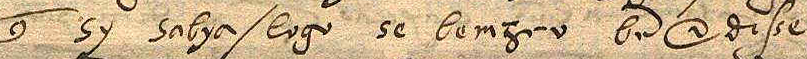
q̄ sy sabya / logo se bemzeo bē e disse
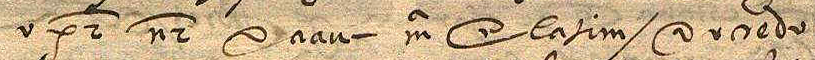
o p̄r n̄r e a aue ma ē latim / e credo
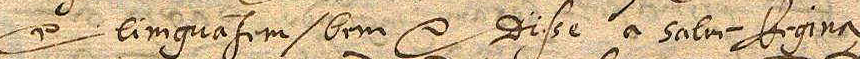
ē limguaJem / bem e disse a salue Regina
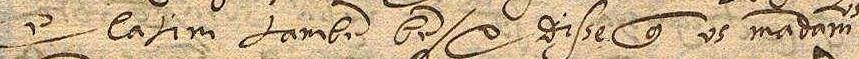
ē latim tambē bē / e disse q̄ os m̄adamtos
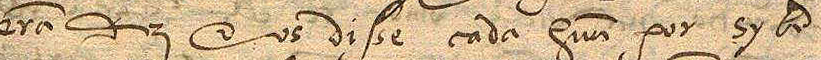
er̄a dez e os disse cada hūu por sy bē
